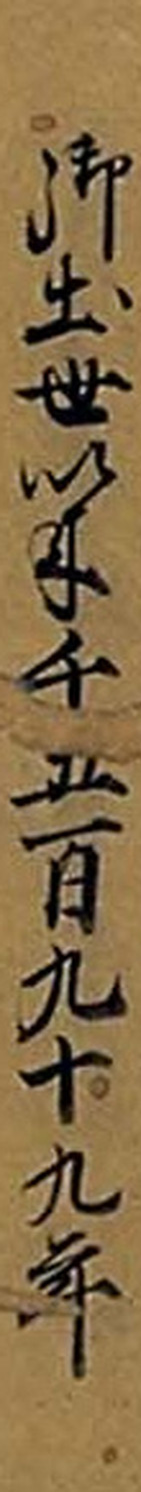御出世以来千五百九十九年
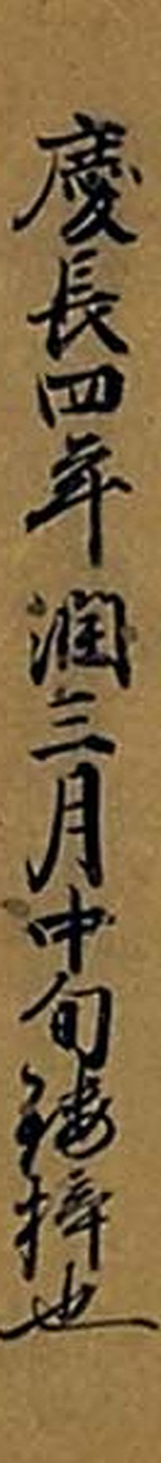慶長四年潤三月中旬鏤梓也
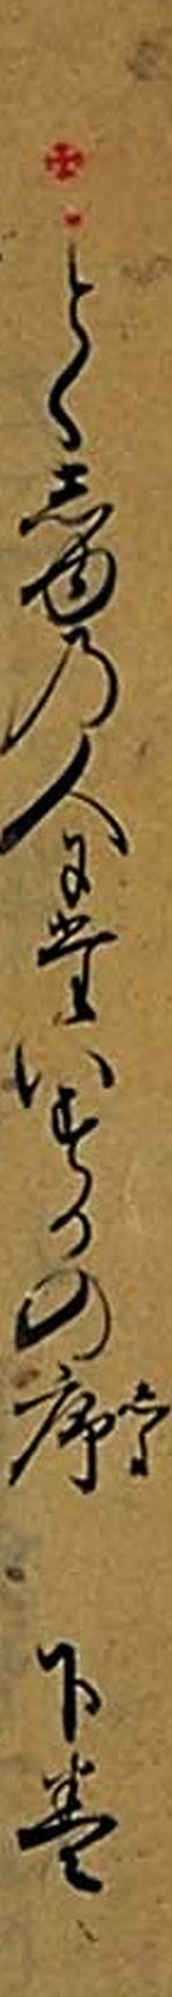✙とくしゆの人にたいするの序下巻
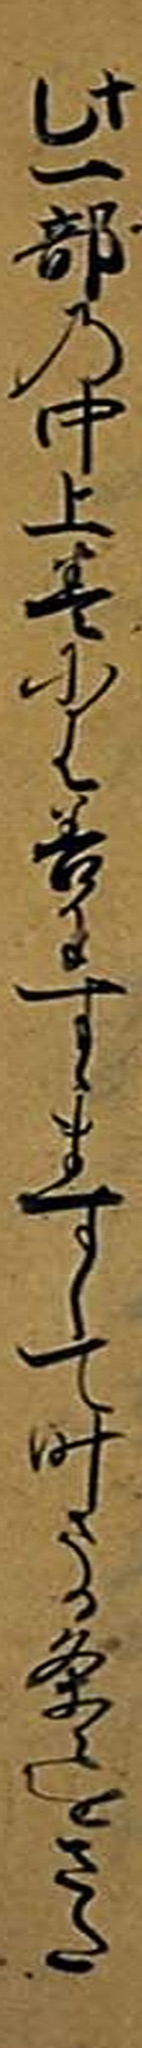此一部の中上巻には善にすゝますして叶さる条々をさた
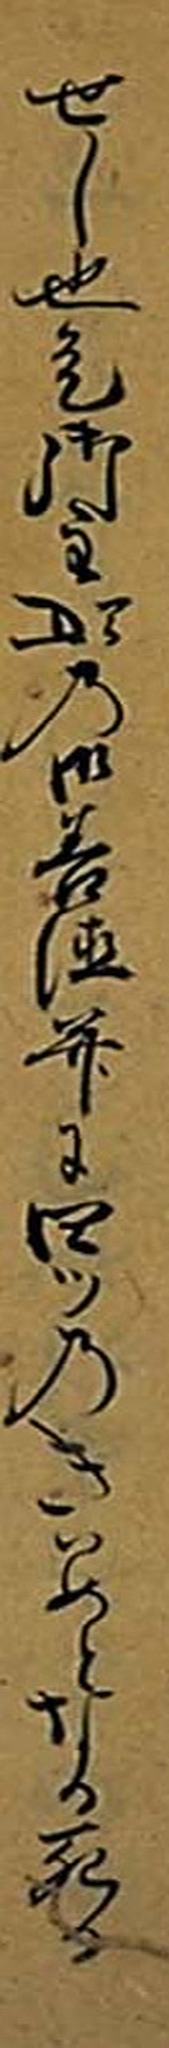せし也是御主の御善徳并に四ツのきはめとなる死る
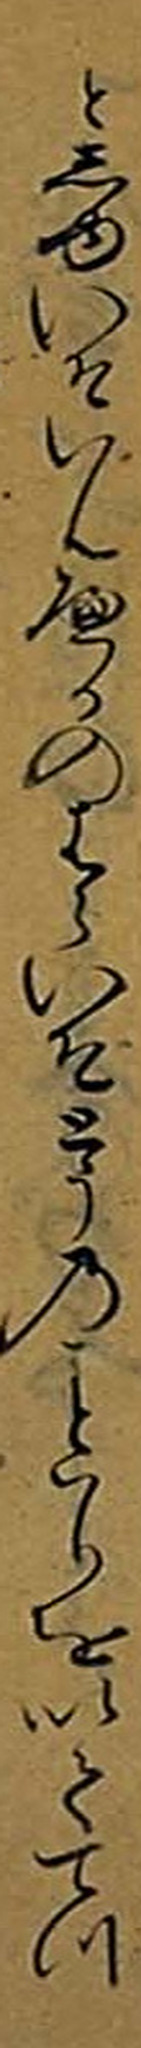としゆいそいんへるのはらいそとうのことはりを以ててつ
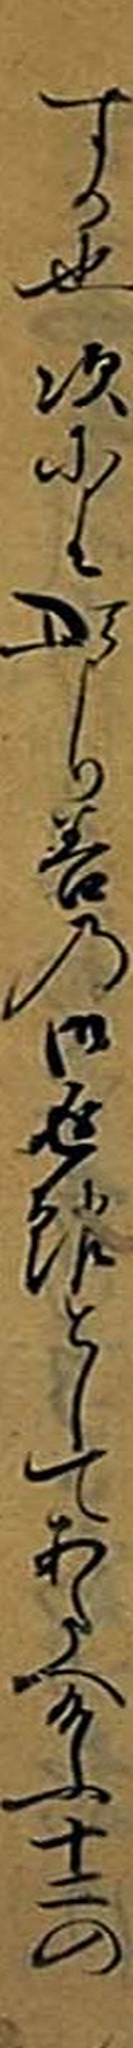する也次にはより善の御返報としてあたへ給ふ十二の
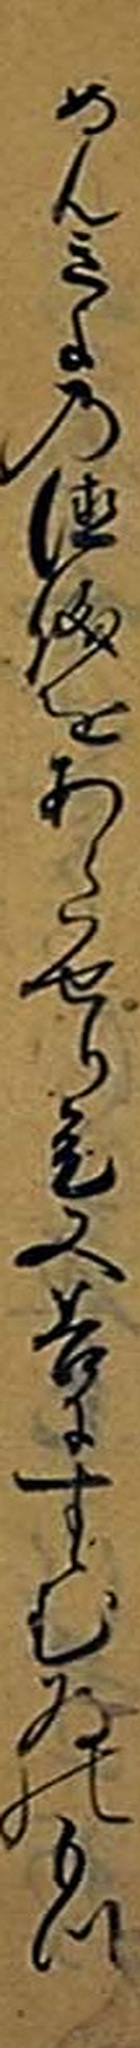めんきよの徳儀をあらはせり是又善にすゝむ為のもつ
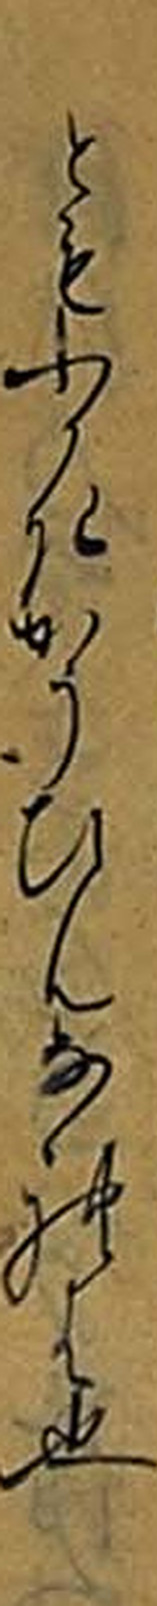ともふかきかうひんなれは也
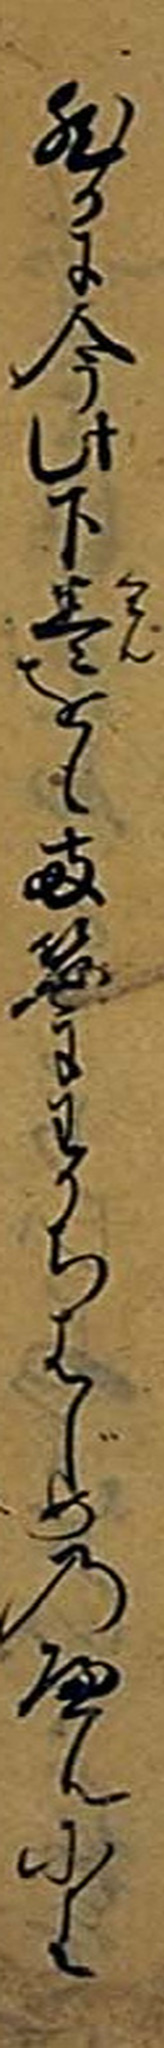然るに今此下巻をも両篇にわかちはじめのへんには
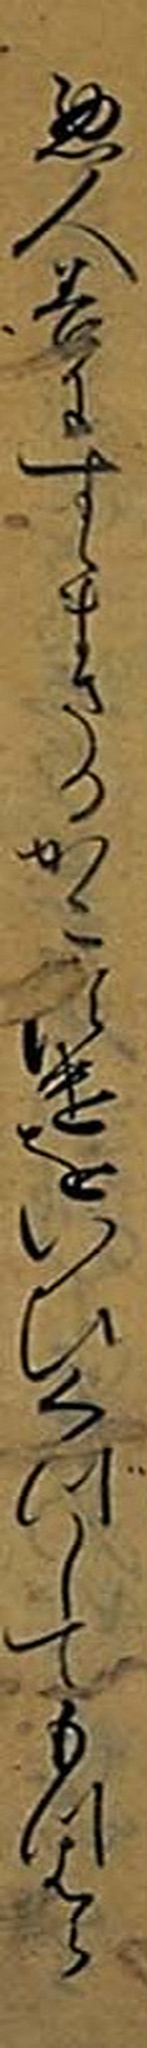悪人善にすゝまさるかこつけをいひくずしてもつはら
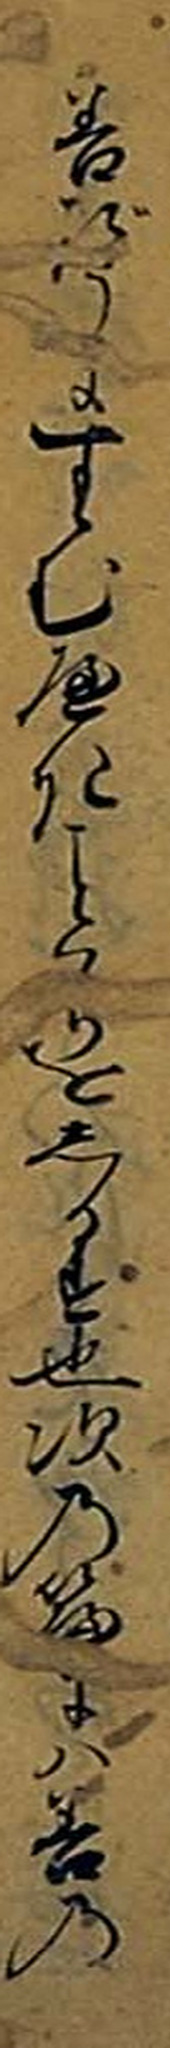善だうにすゝむへきことはりをしるす也次の篇には善の

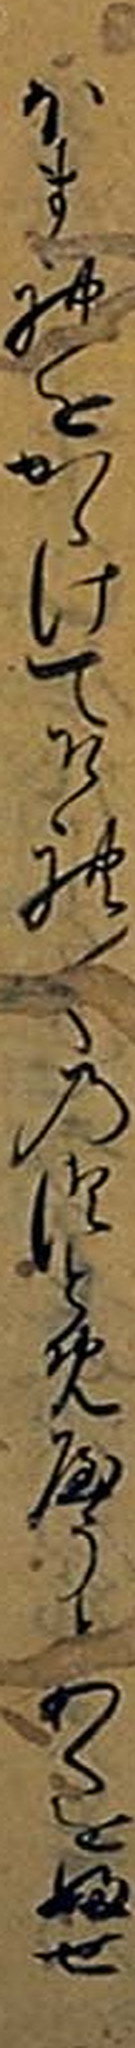ほまれをかゝけてそれ〳〵のつとめやうとあくをふせ
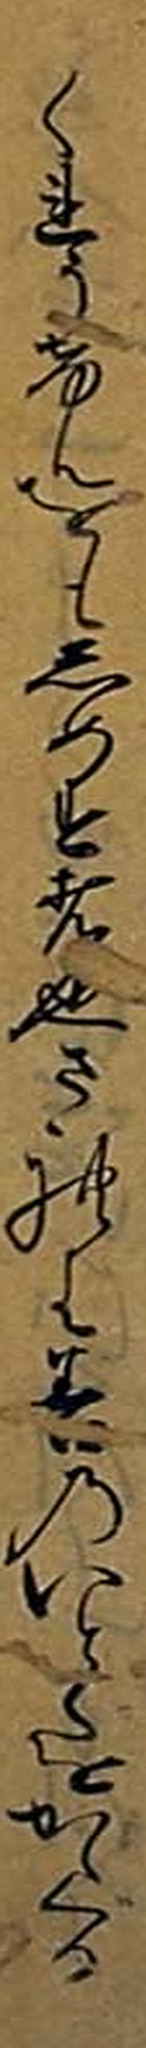くれうけんをもしめす考也されは善のいとくをかゝくる
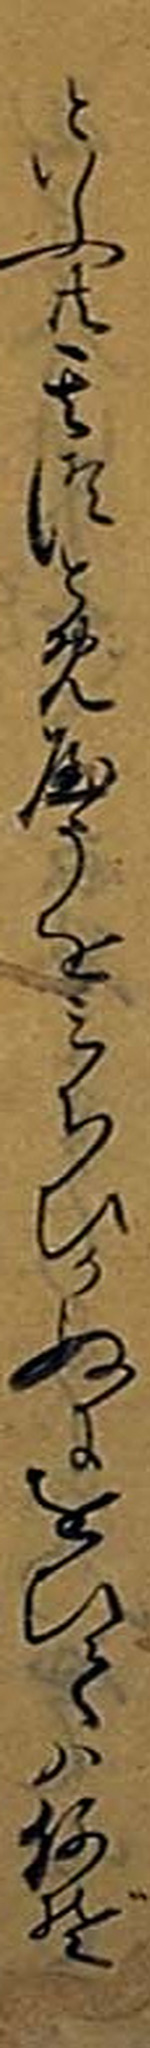といふ共其つとめやうをみちひかぬにをひては何そ
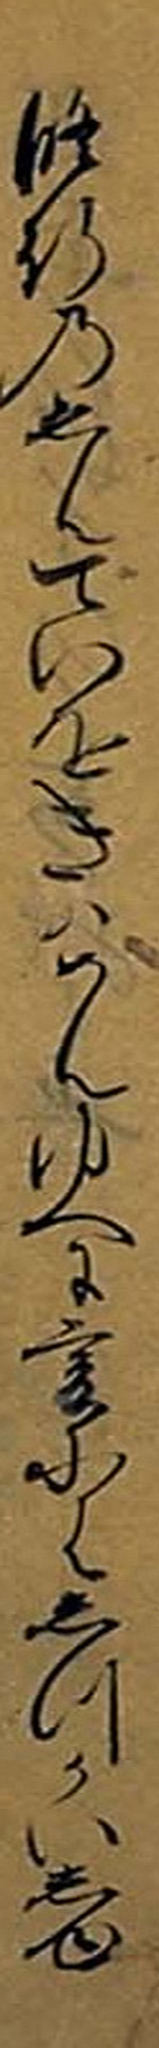修行のしんていをきはめんゆへに爰にはしつかいしゆ
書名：ぎやどぺかどる
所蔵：東京大学総合図書館 / General Library in the University of Tokyo
